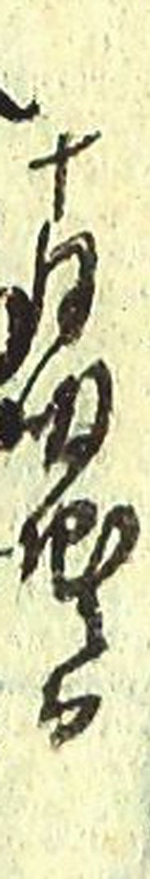十月明地にて
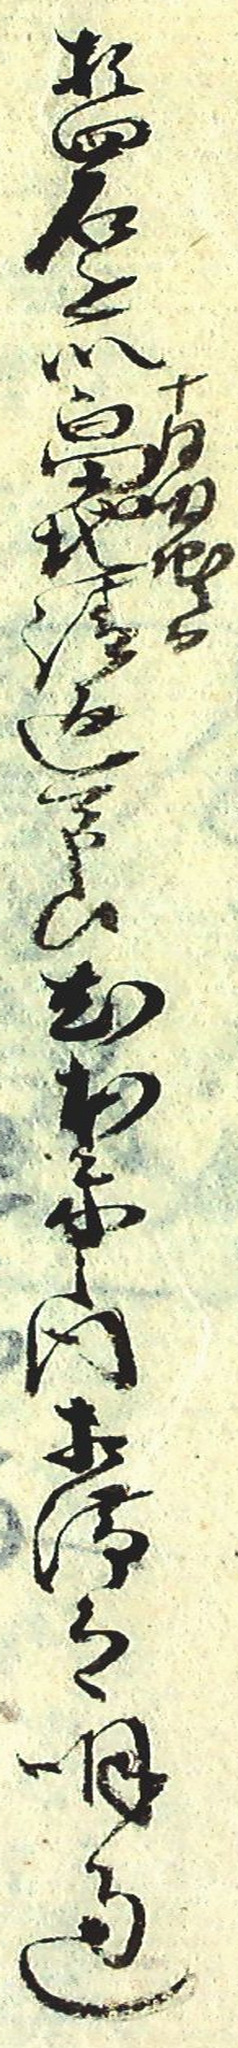拾四石を以畠地請返可申候尤本米之内相滞候はゝ明通
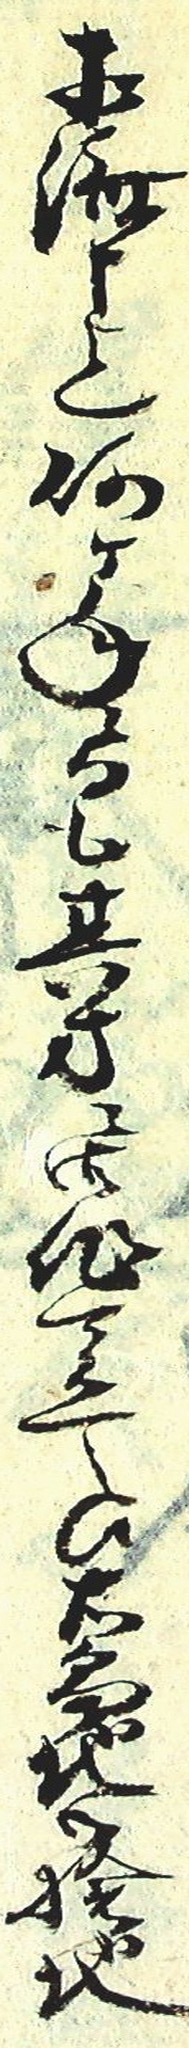相済申迄何ヶ年にても其方に御作可有之候右畠地御検地
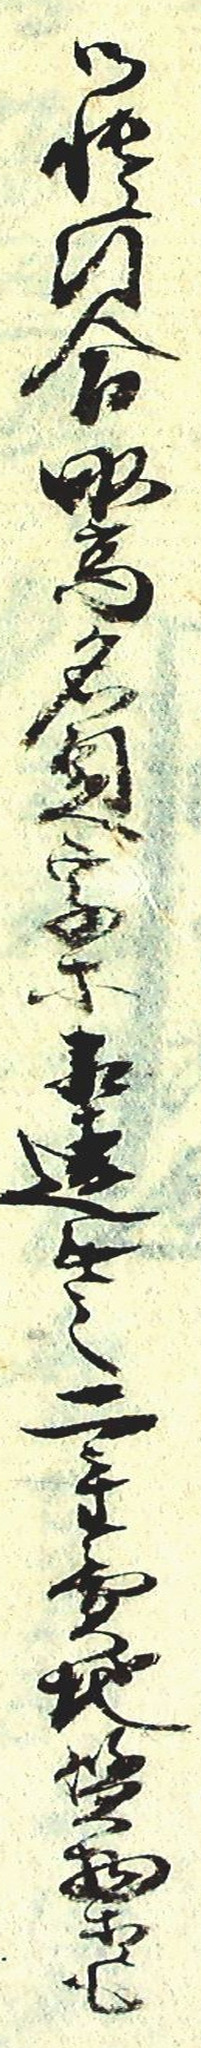御帳に引合畝高名負字等相違無之二重売地質物等にも
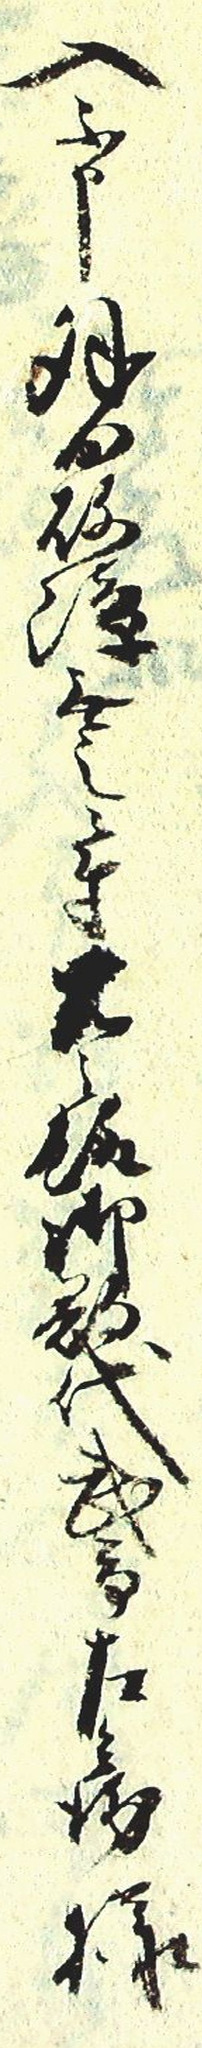入不申外ゟ故障無之に付右之趣御郡代武市左兵衛様
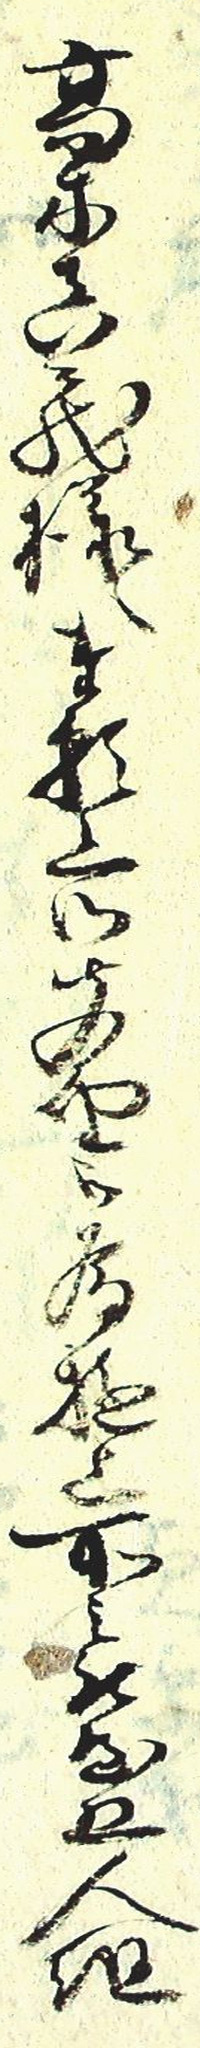高木真蔵様へ奉願上御聞届被為遊上所之庄屋五人組
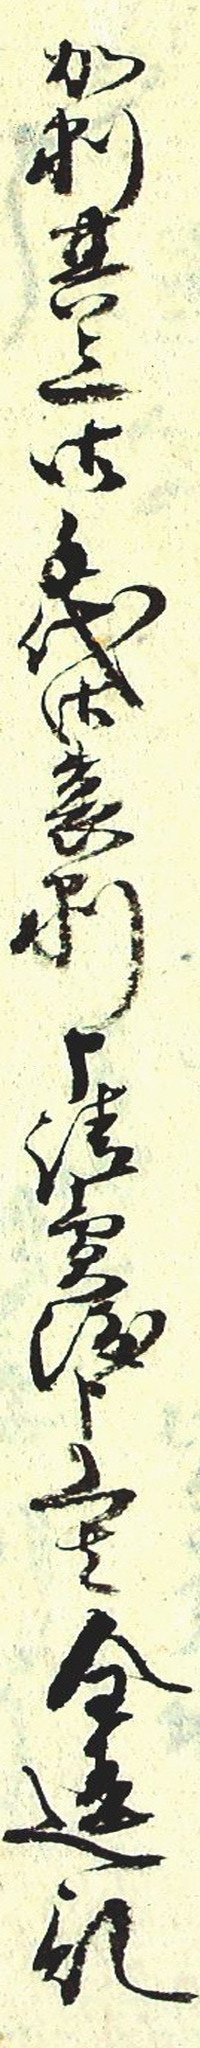加判其上御手代御裏判申請売渡申上は全違乱
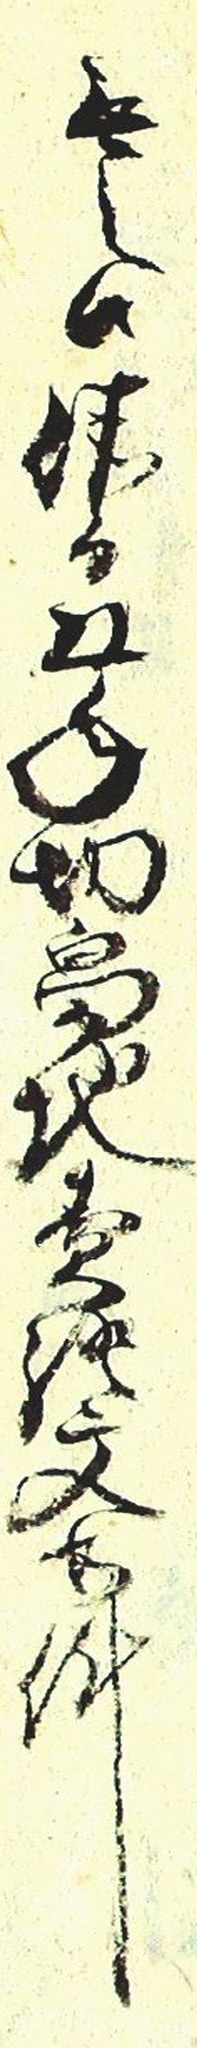無之候依て五年切畠地売証文如件

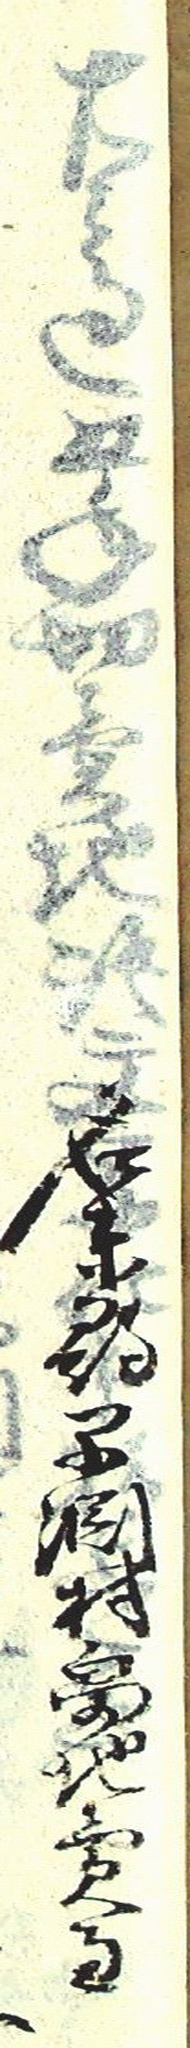名東郡早淵村畠地売主
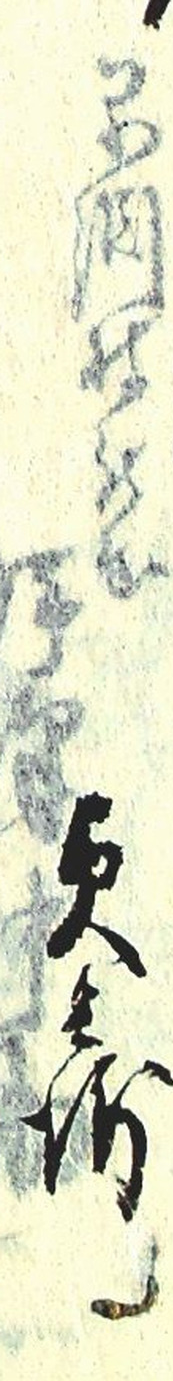貞兵衛
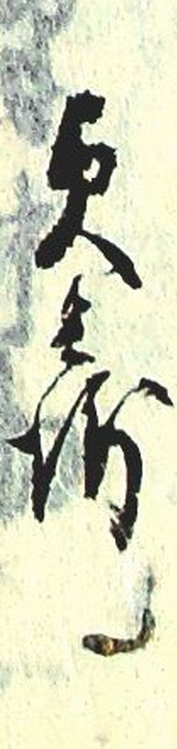貞兵衛
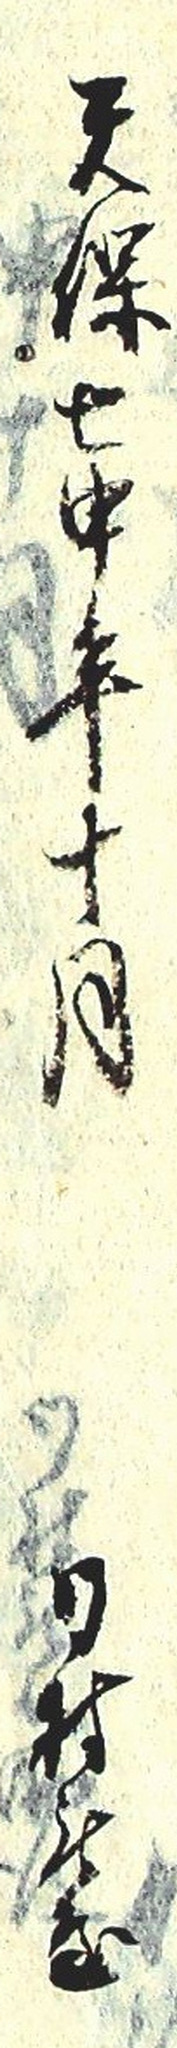天保七申年十月同村庄屋
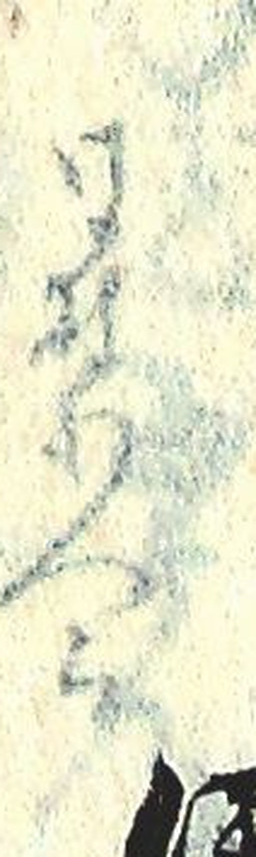同村五人与
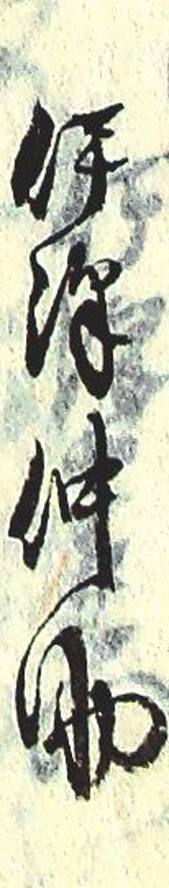伊沢仲助
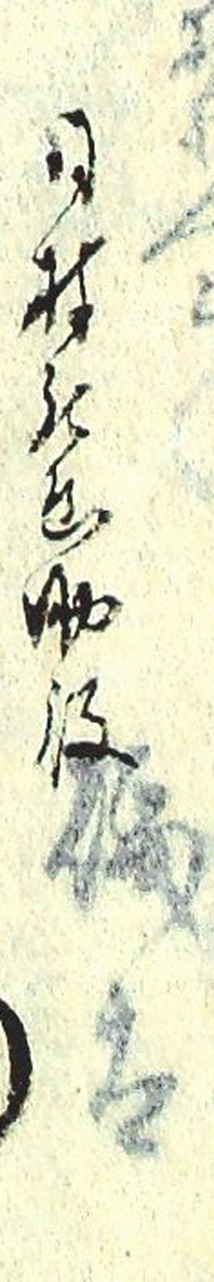同村庄屋助役
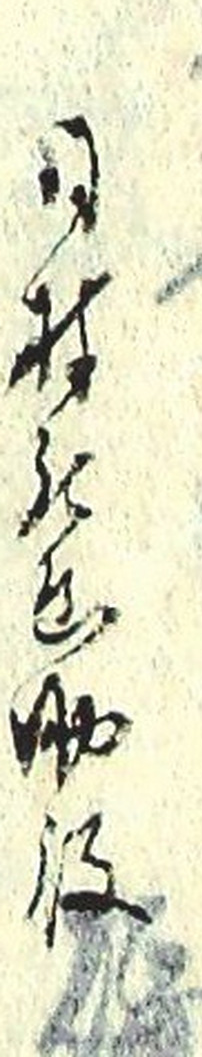同村庄屋助役
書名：諸御願書控(弐番）
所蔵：鳴門教育大学 Naruto University of Education
